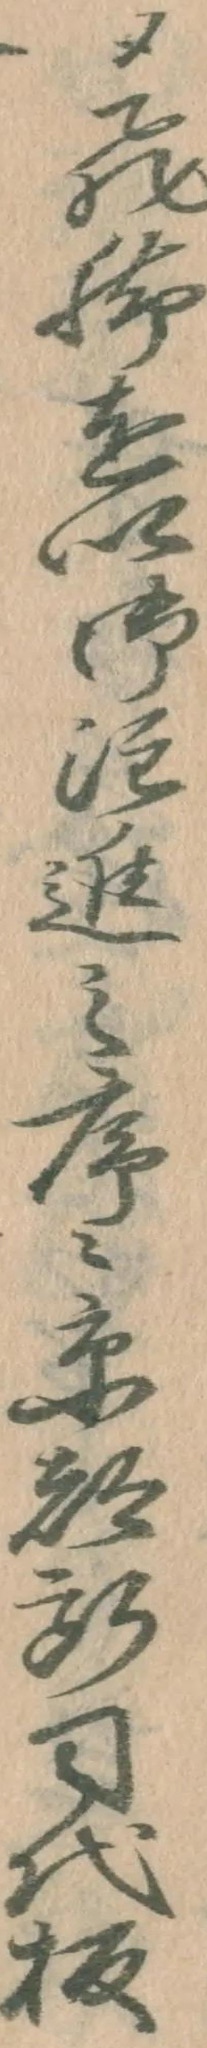〆飛脚を以御注進之序に京都所司代板
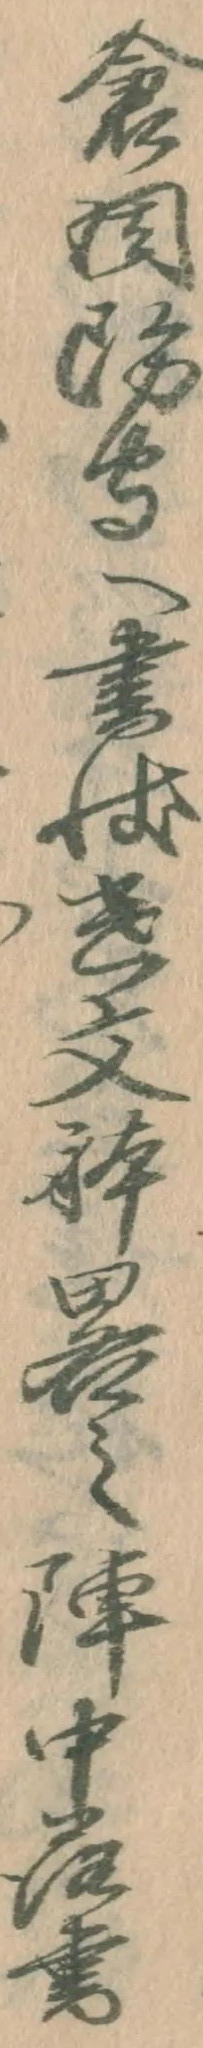倉周防守へ書状遣文躰畧之陣中落書
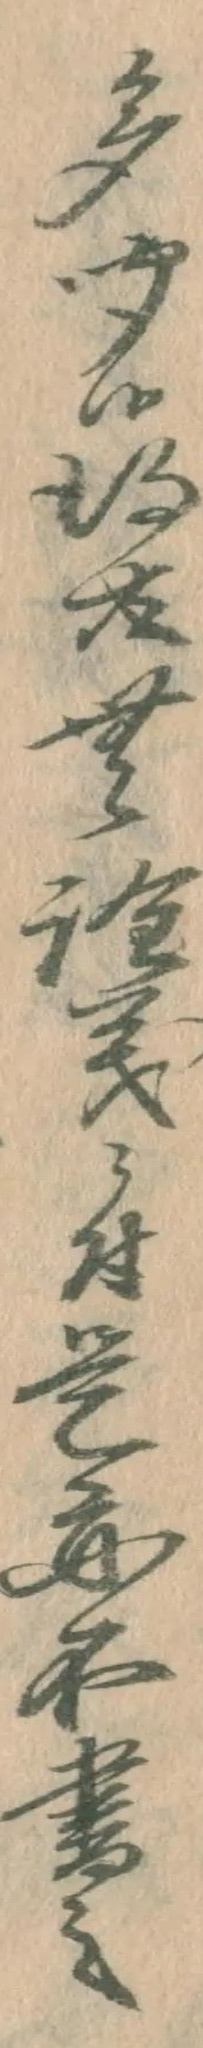多聞候得共無詮義に付是亦不書之
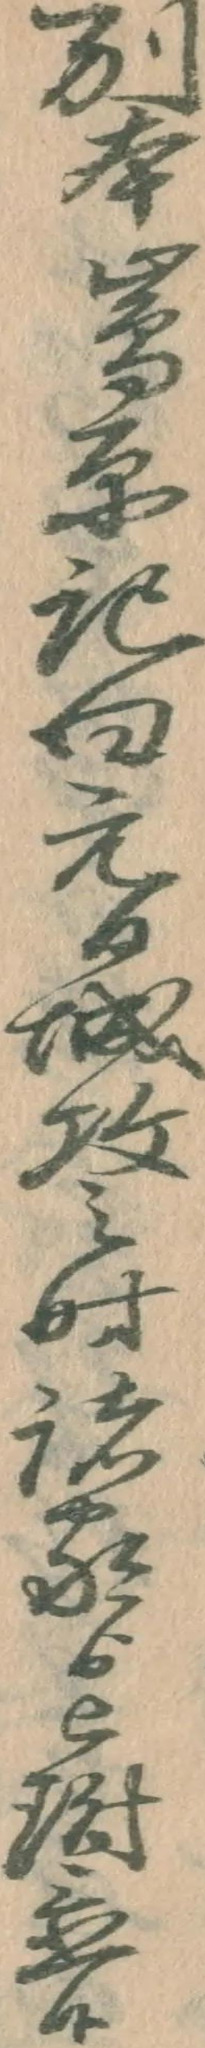別本島原記曰元日城攻之時諸家ゟ被附置候
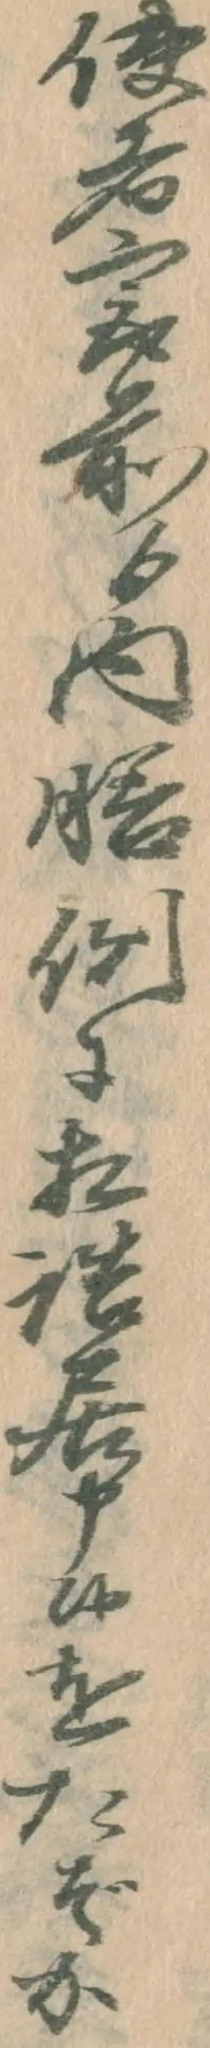使者最前ゟ内膳例尓相詰居申候をたばか
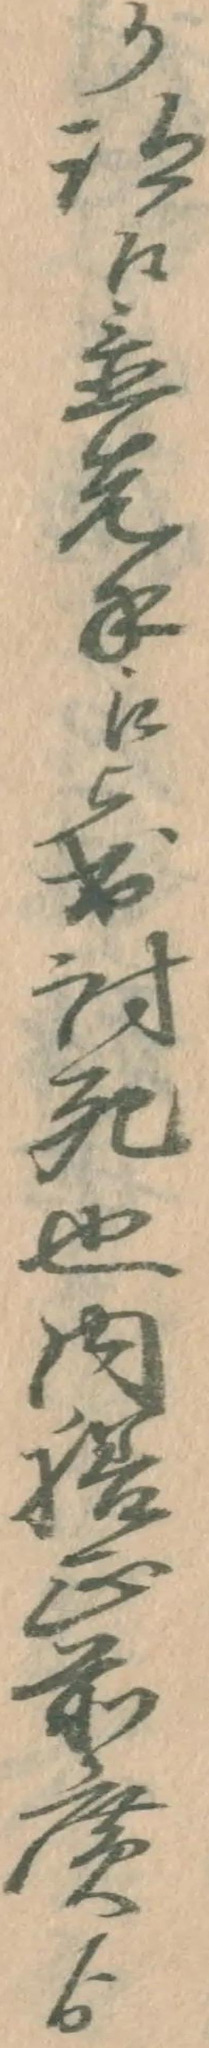り跡江置先手江被出討死也内膳正前広ゟ

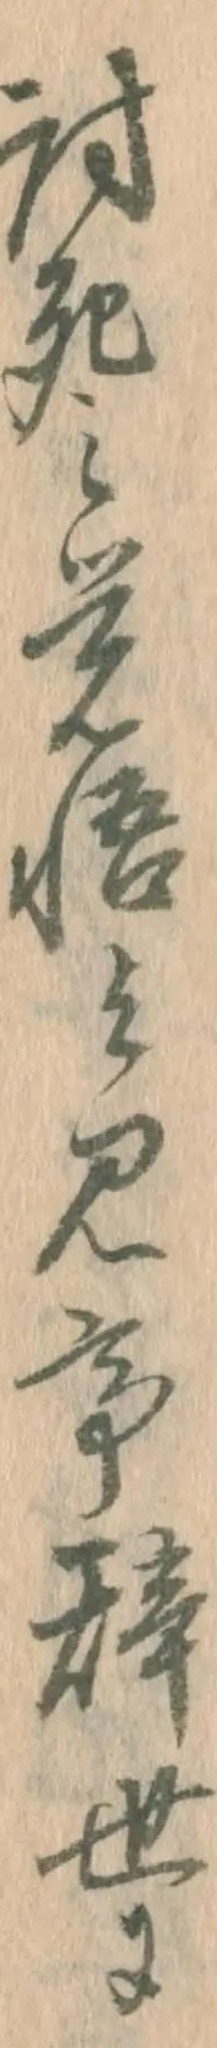討死之覚悟与見亭辞世尓
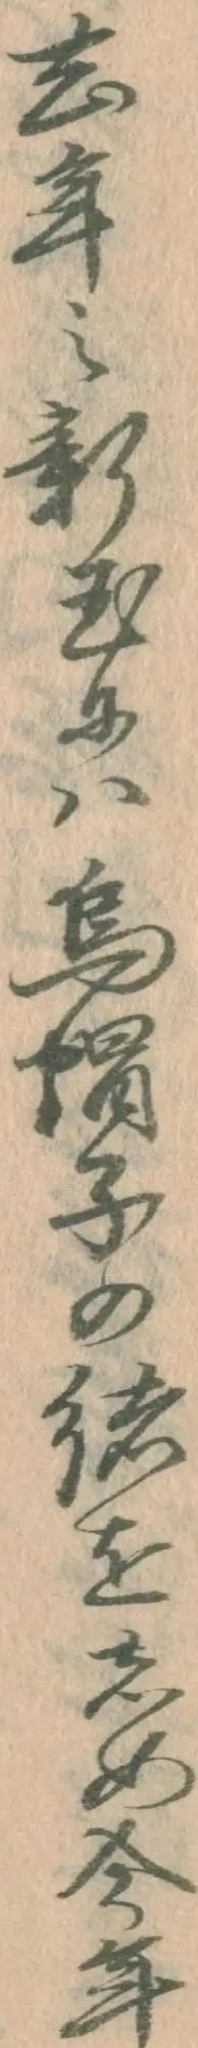去年之新玉尓は烏帽子の緒を志め今年
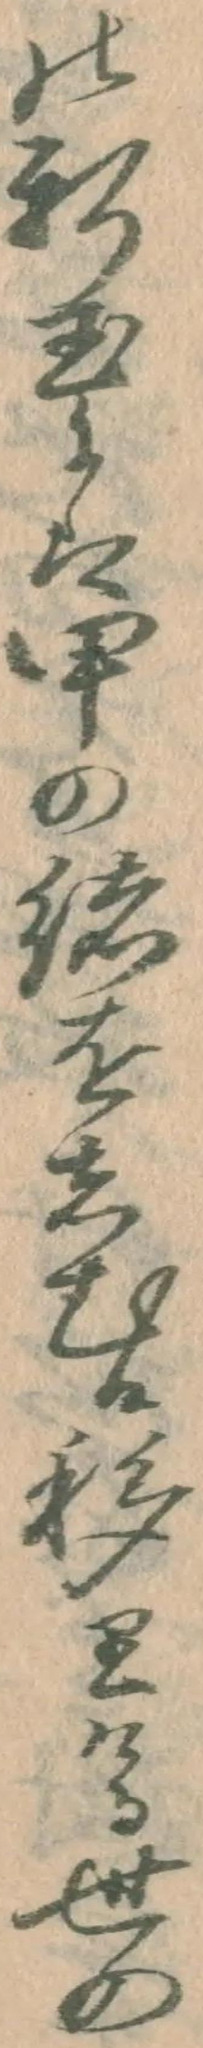能新玉尓盤甲の緒を志む候移里ける世の
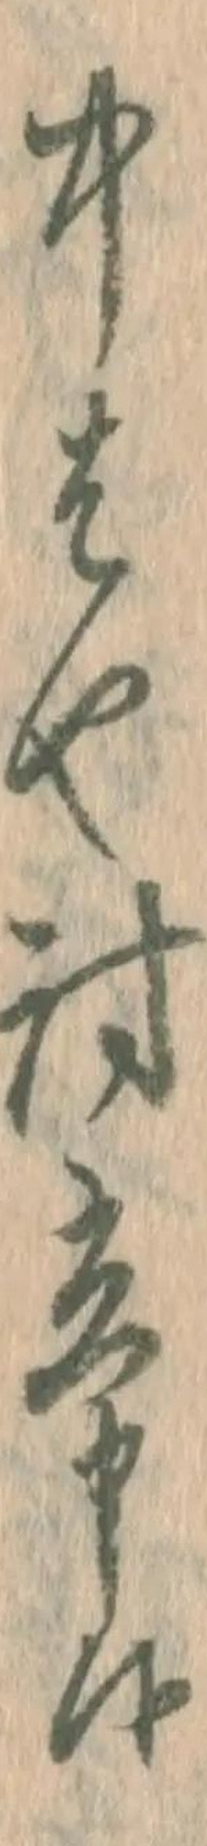中者や討立申候
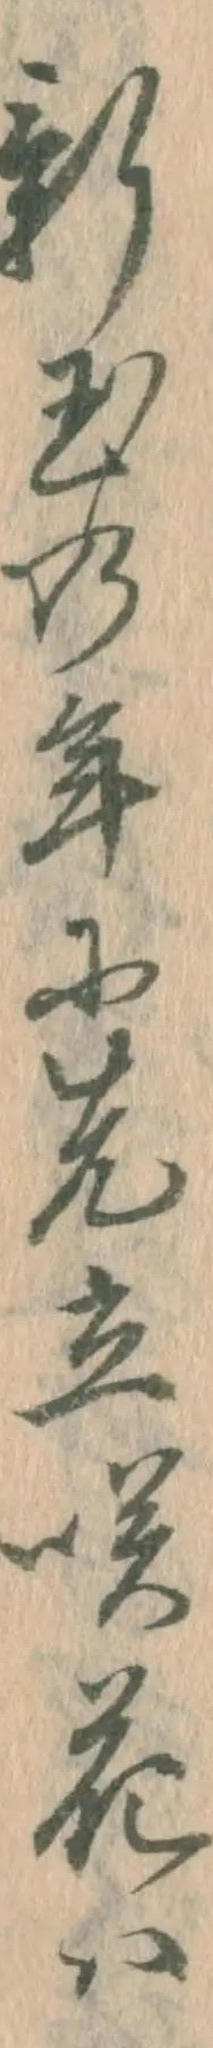新玉乃年尓先立咲花は
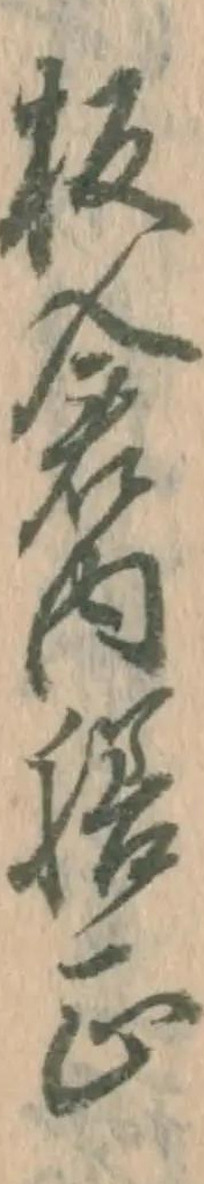板倉内膳正
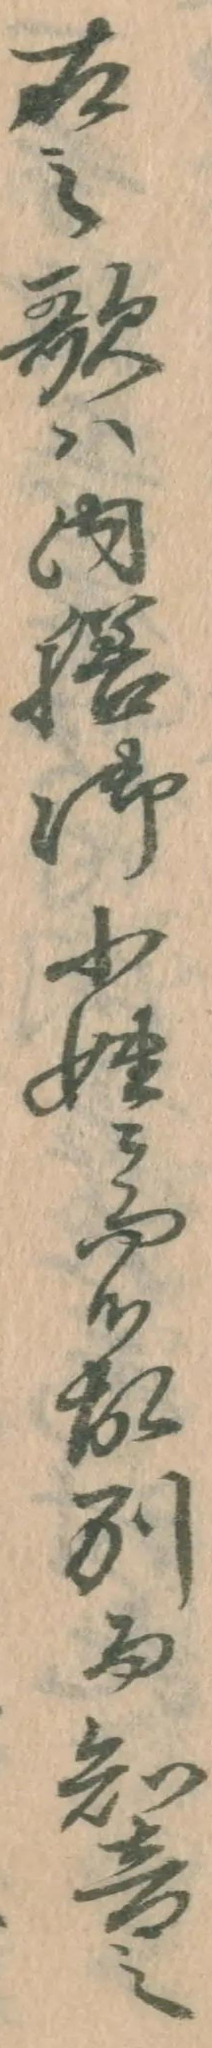右の歌は内膳御小姓に而候故別而知音之
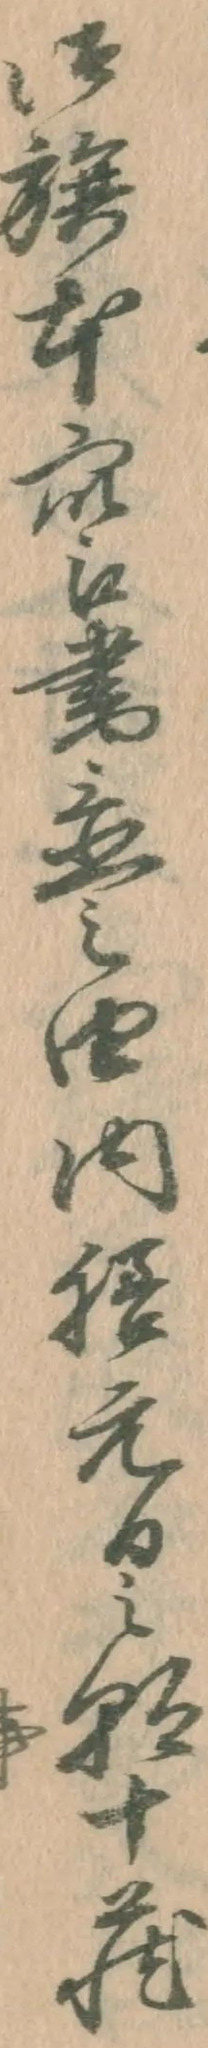御旗本衆江書置之由内膳元日之朝十蔵
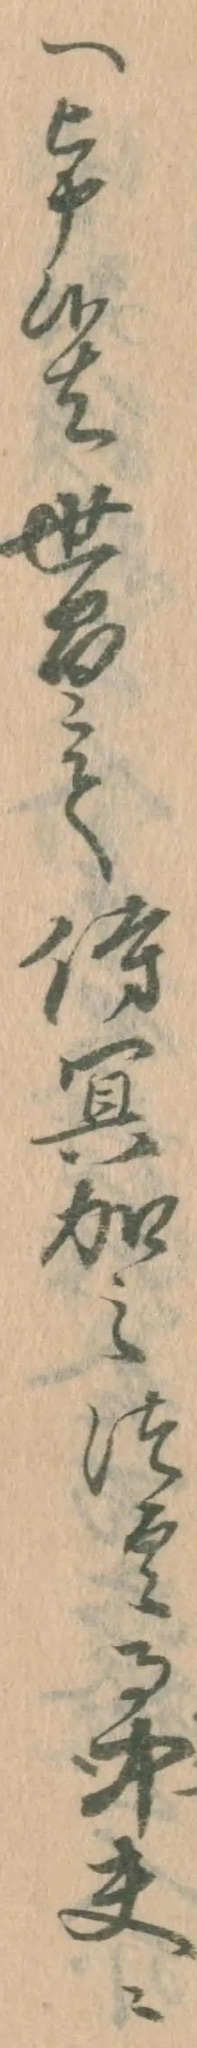へ被申候者世間にて侍冥加之徒具る中夫々
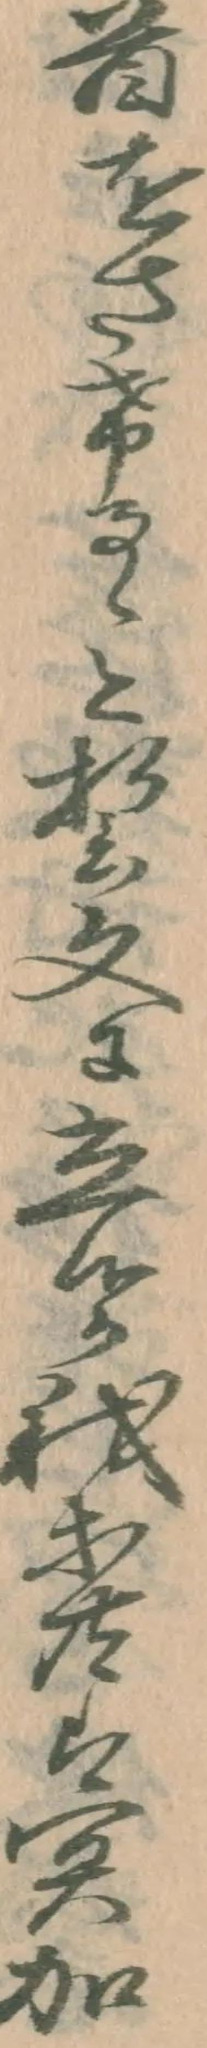首をさ希るゝと誓文尓立候か我等共盤冥加
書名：切支丹御退治記 49巻. [5]
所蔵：国立国会図書館 National Diet Library, JAPAN
